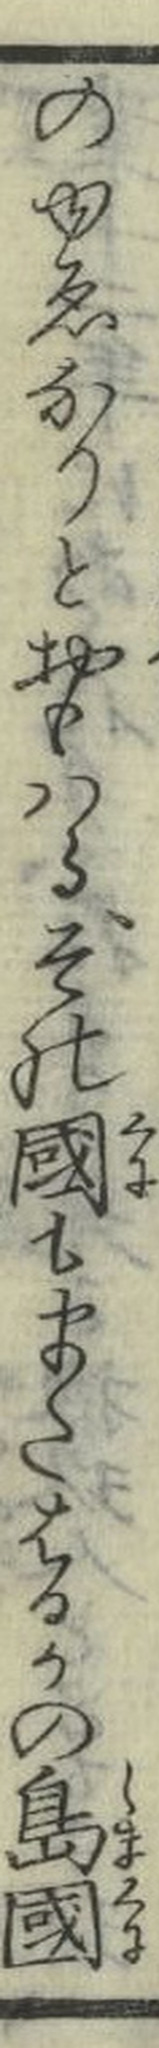のゆゑなりとおもはる、その国もまたはるかの島国
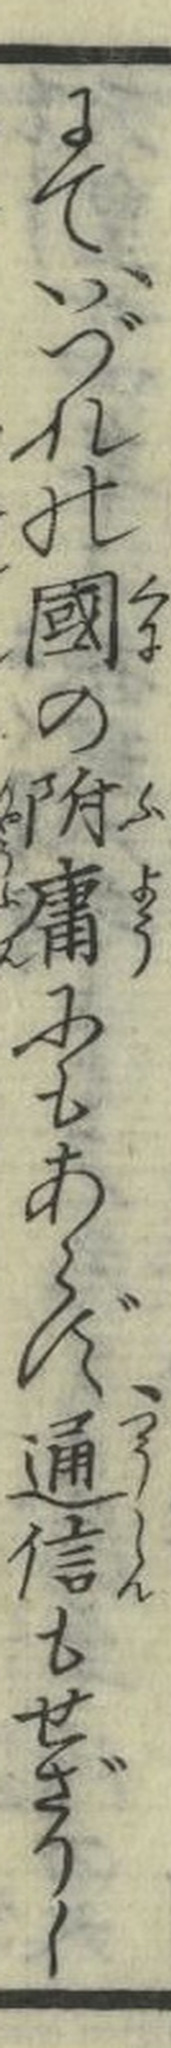にて、いづれの国の附庸にもあらず、通信もせざりし
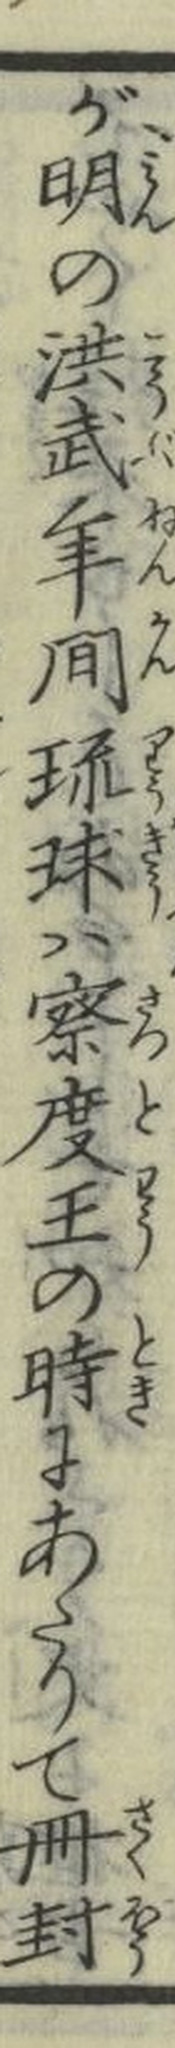が、明の洪武年間琉球は察度王の時にあたりて冊封
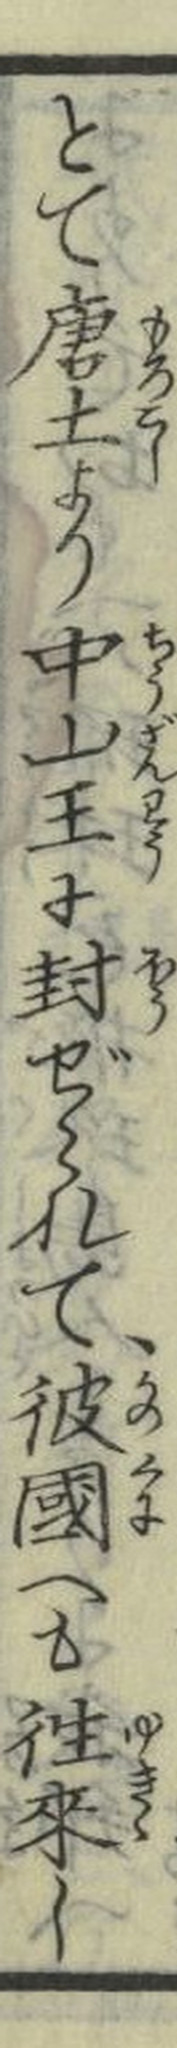とて唐土より中山王に封ぜられて、彼国へも往来し
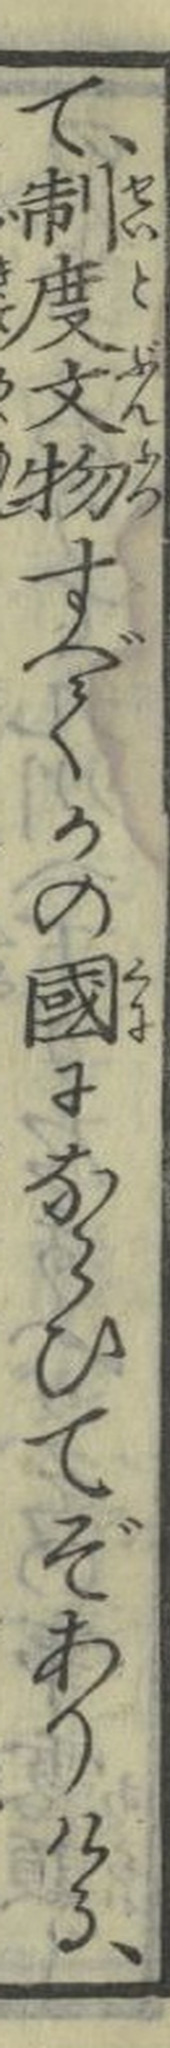て、制度文物すべてかの国にならひてぞありける、
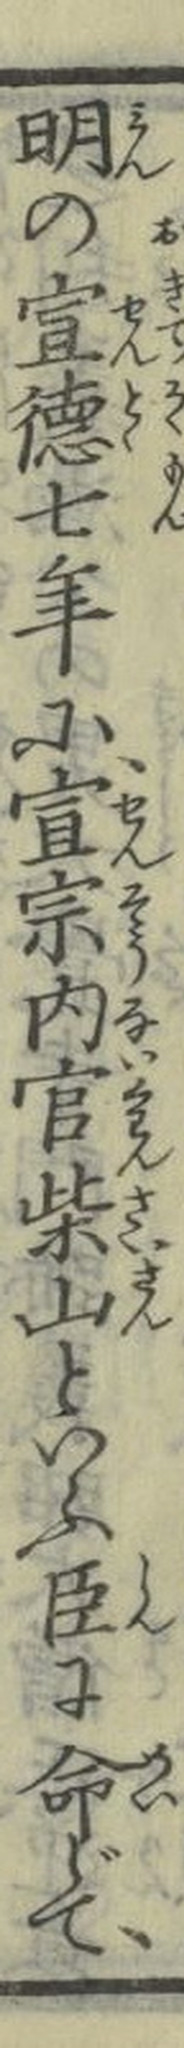明の宣徳七年に、宣宗内官紫山といふ臣に命じて、
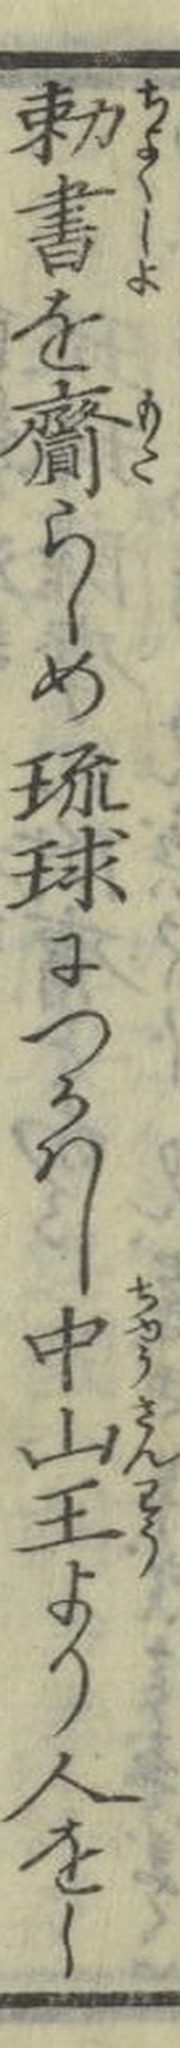勅書を齎らしめ琉球につかはし、中山王より人をし
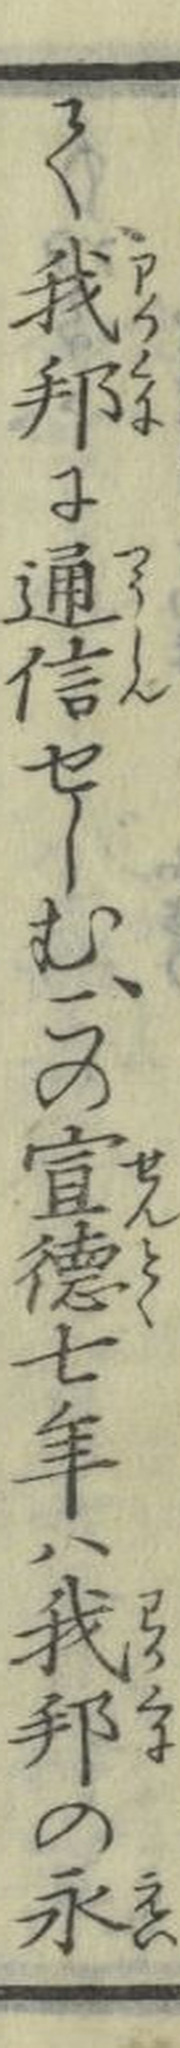て、我邦に通信せしむ、この宣徳七年は我邦の永
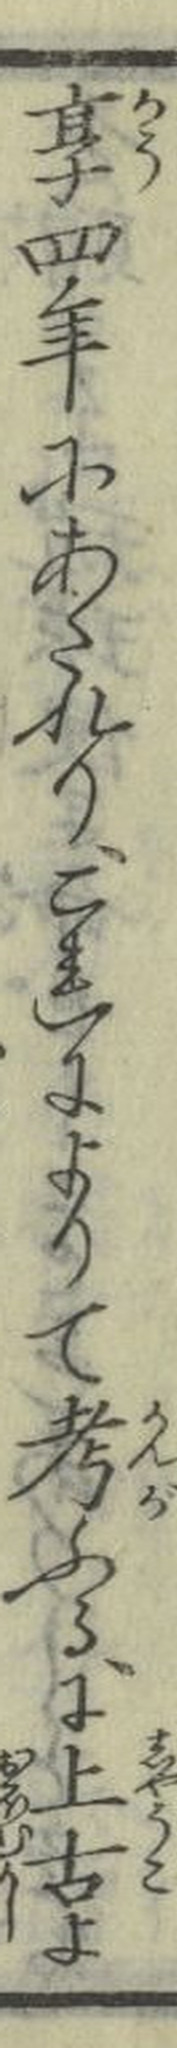享四年にあたれり、これによりて考ふる、に上古よ
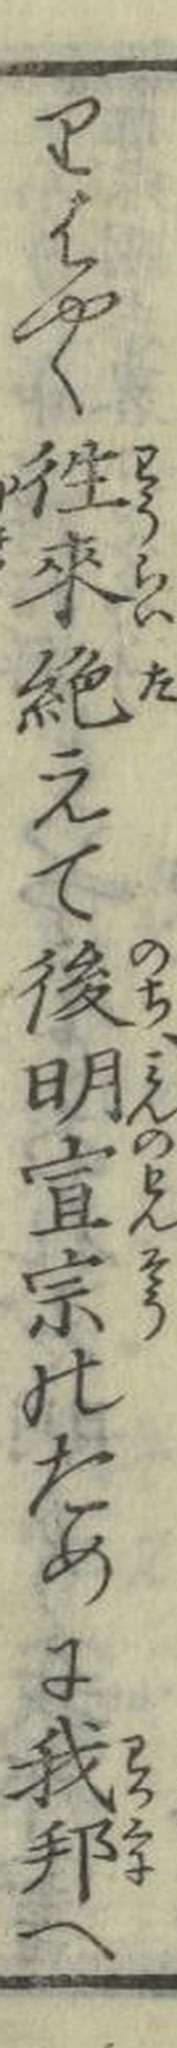りはやく往来絶えて後、明宣宗のために我邦へ
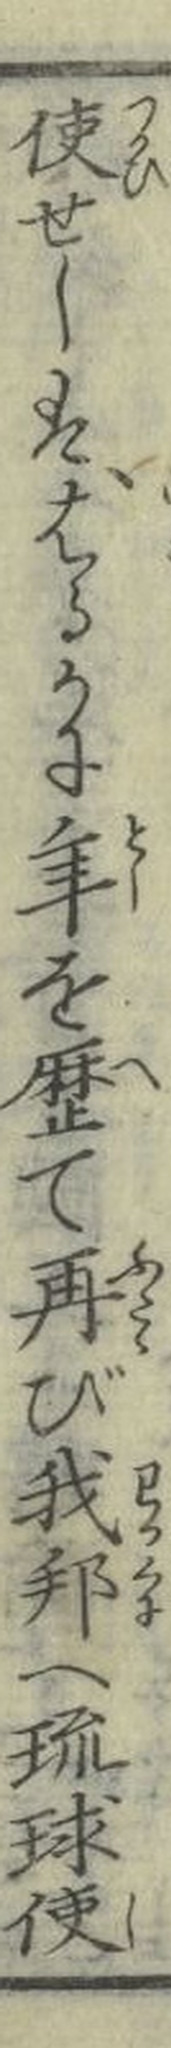使せしは、はるかに年を歴て再び我邦へ琉球使
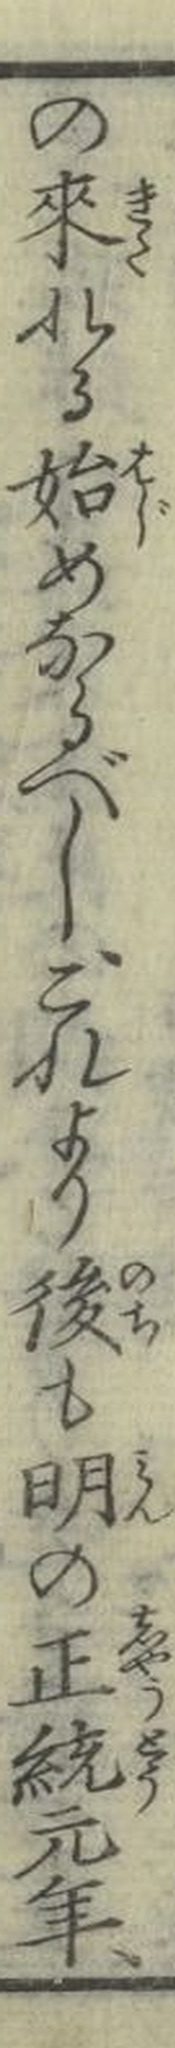の来れる始めなるべし、これより後も明の正統元年、
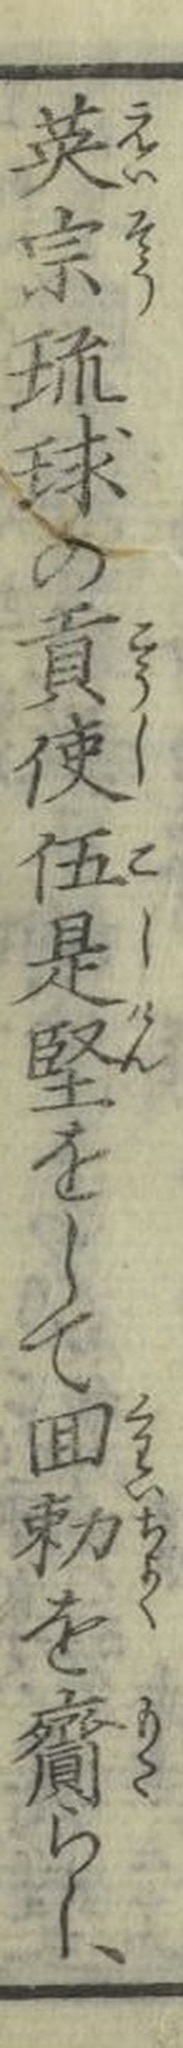英宗琉球の貢使伍是堅をして回勅を齎らし、

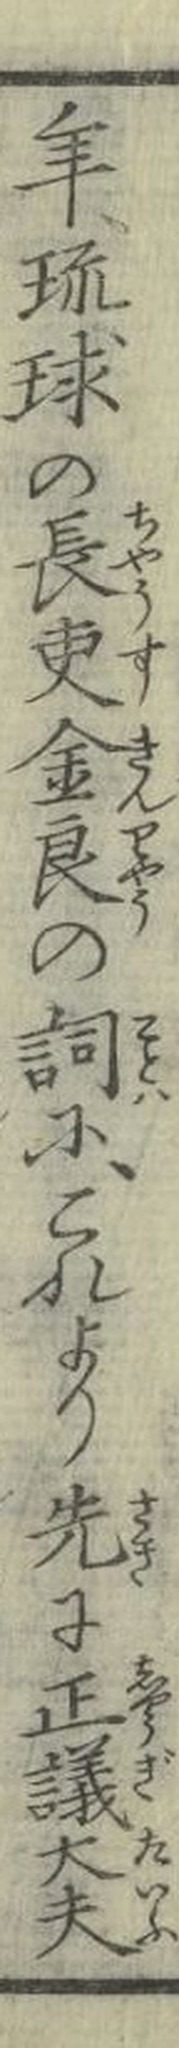年、琉球の長吏金良の詞に、これより先に正議大夫
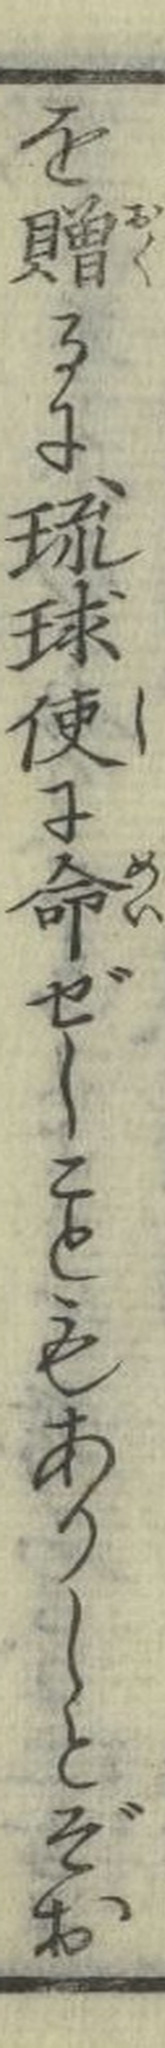を贈るに、琉球使に命ぜしこともありしとぞお
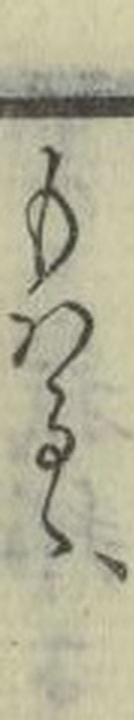もはるゝ、
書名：琉球入貢紀畧
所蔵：University of the Ryukyus Library
